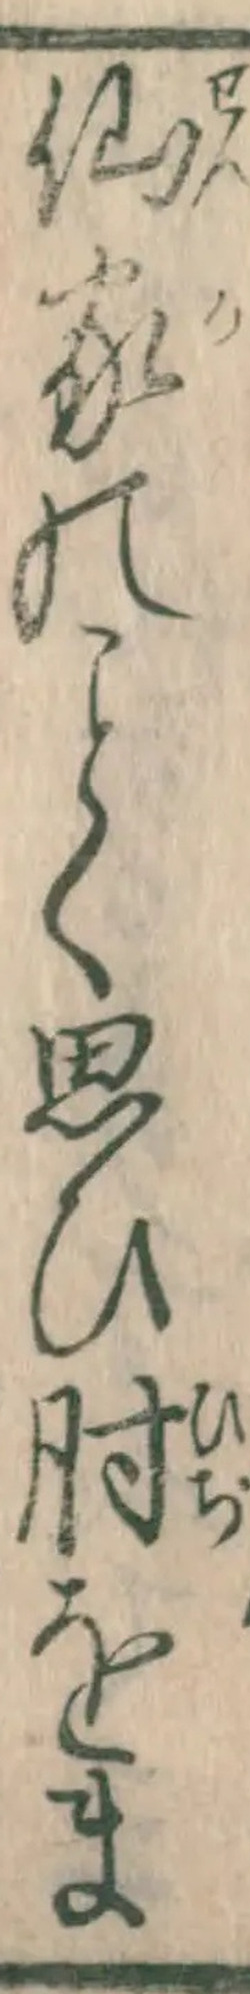仙家のことく思ひ肘をま
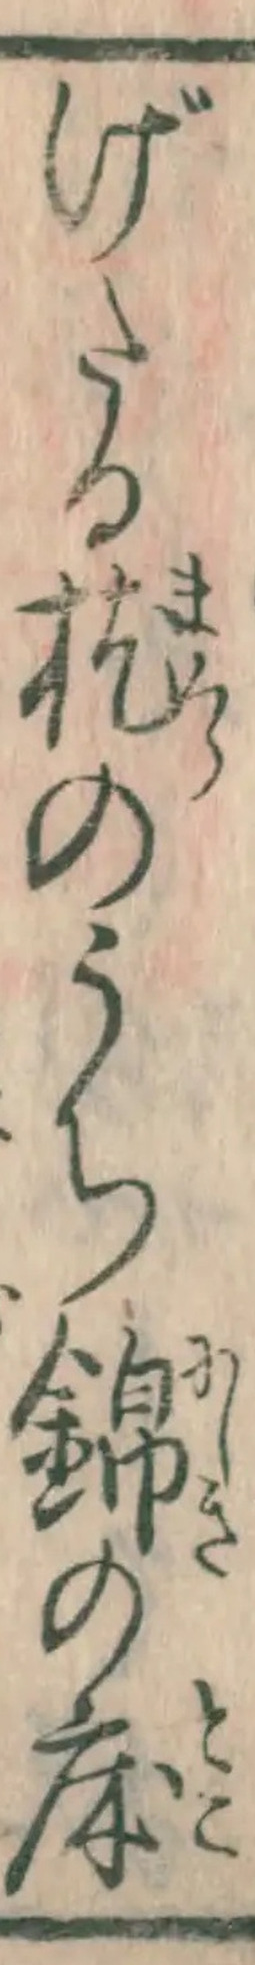げたる枕のうち錦の床
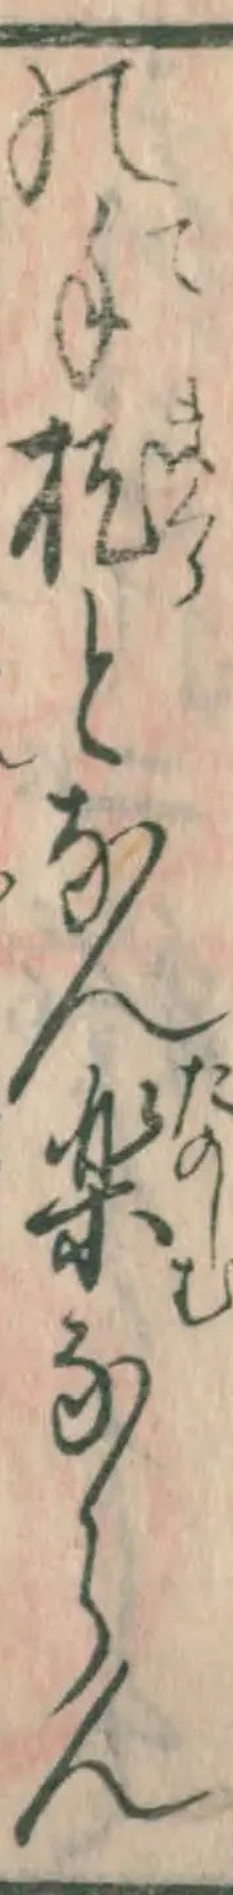の手枕となん楽ならん
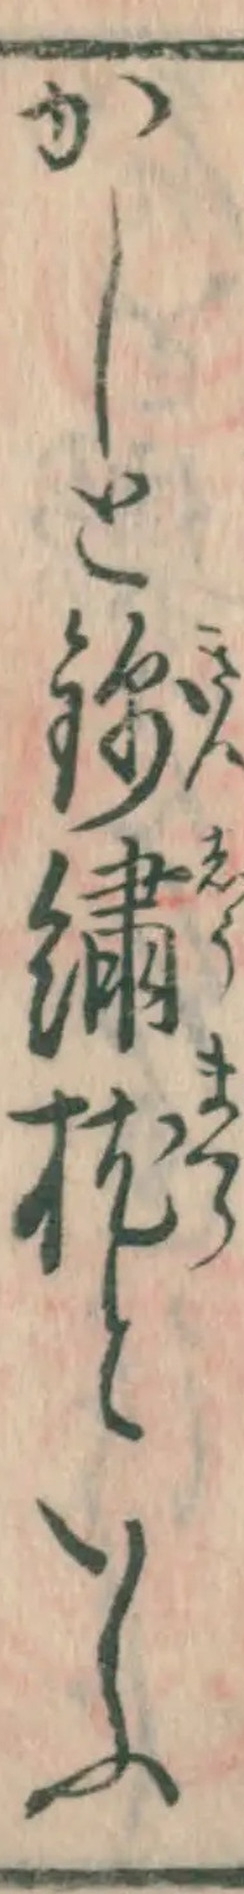かしと錦繍枕といふ
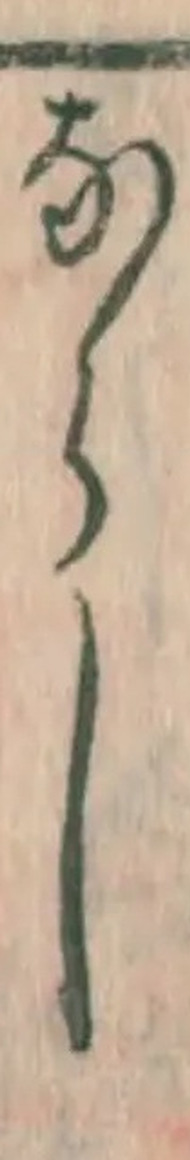ならし
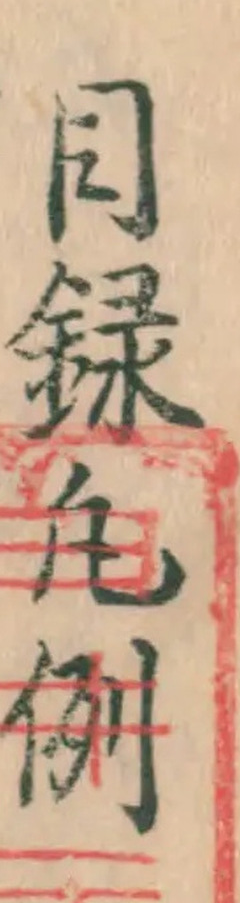目録凡例
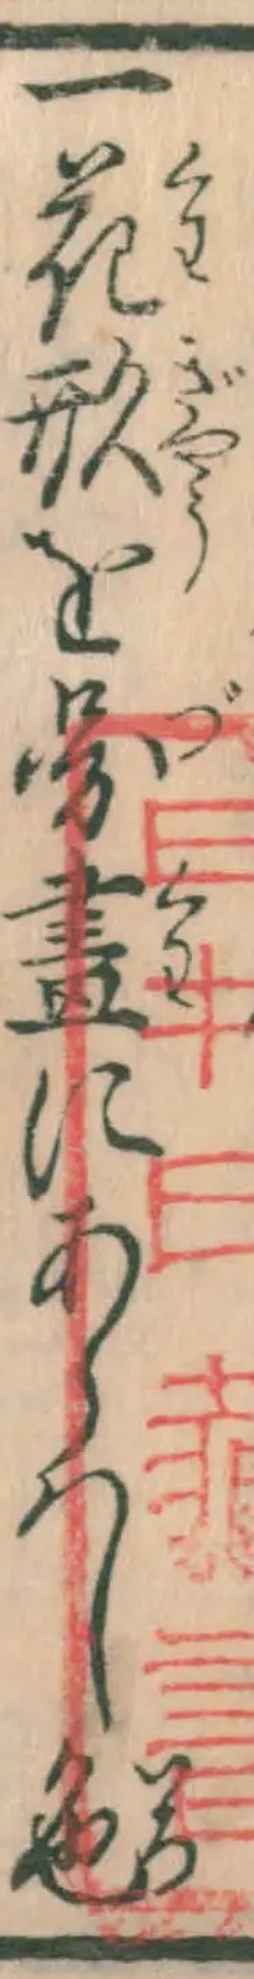一花形を図画にあらはし色
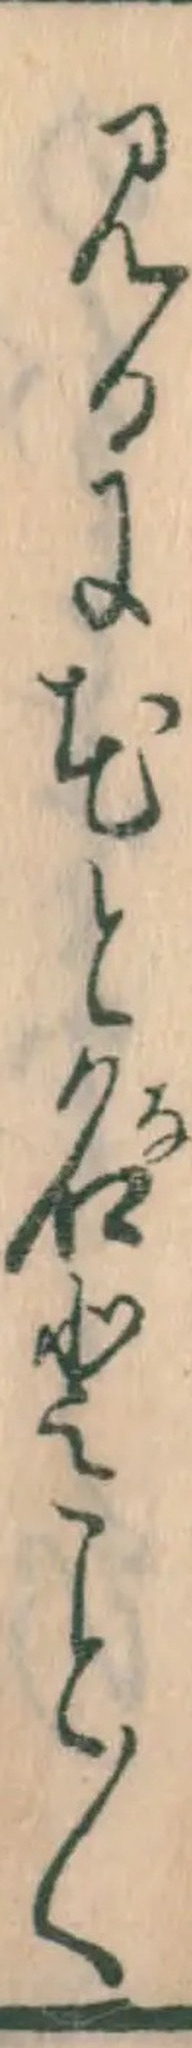見るに花と名とこと〳〵
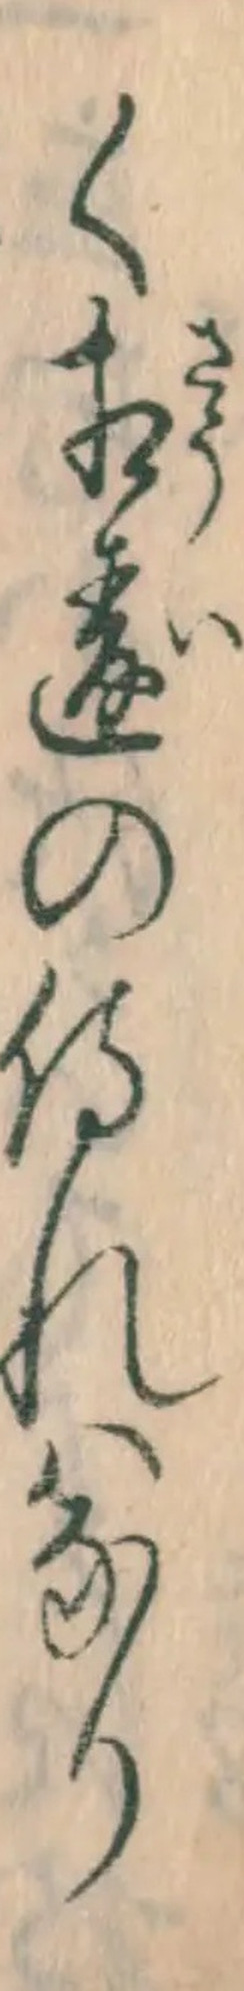く相違の侍れはなり
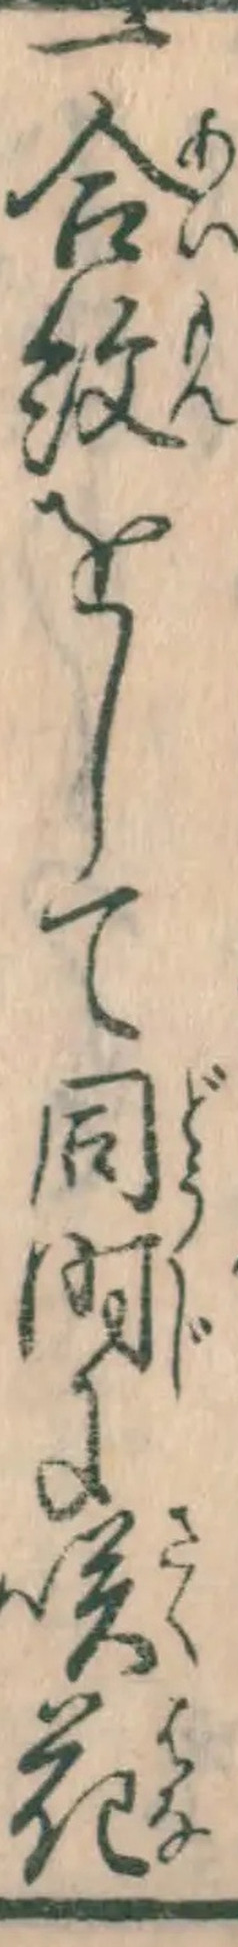一相紋をして同時に咲花
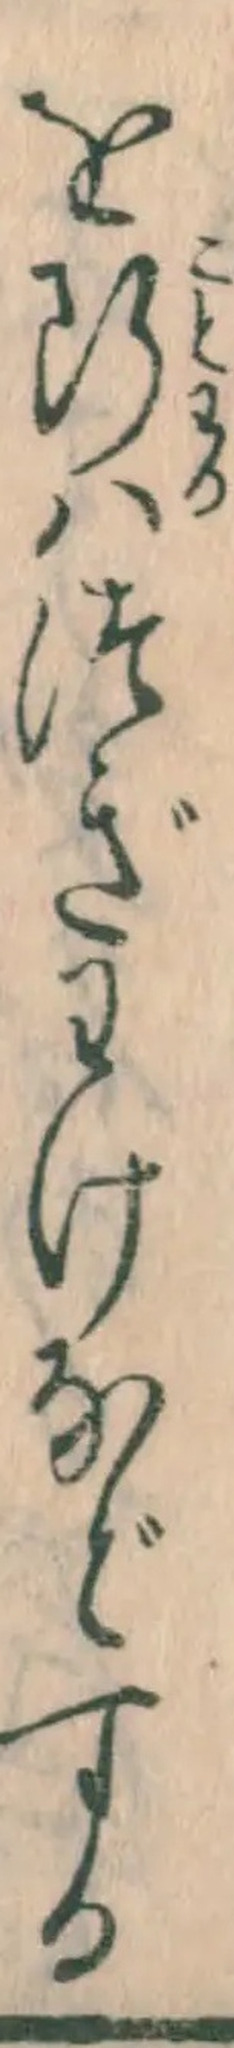を断はつぎわけなどする
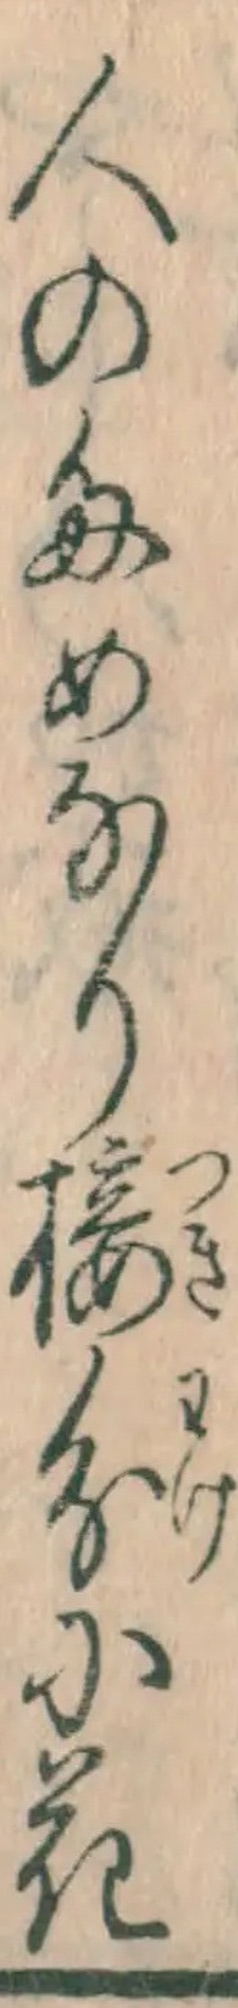人のためなり接分に花
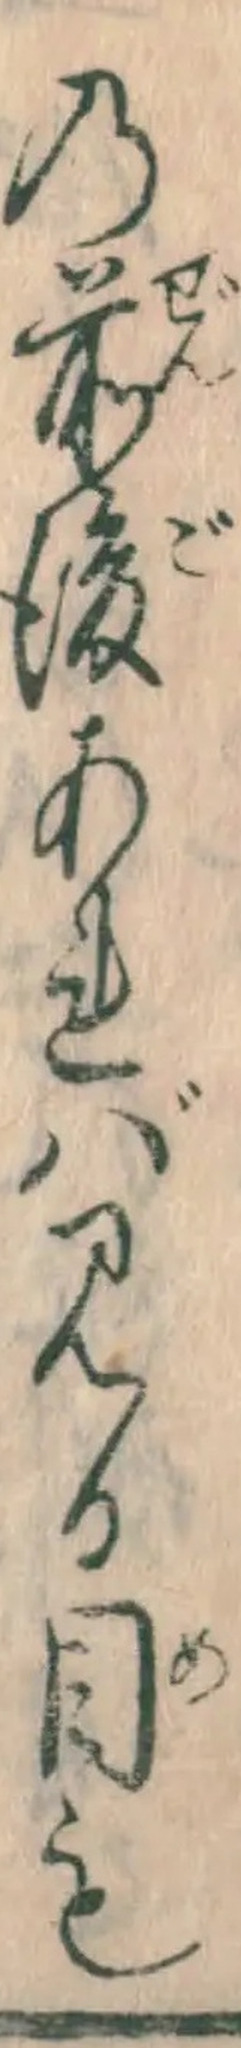の前後あれば見る目も
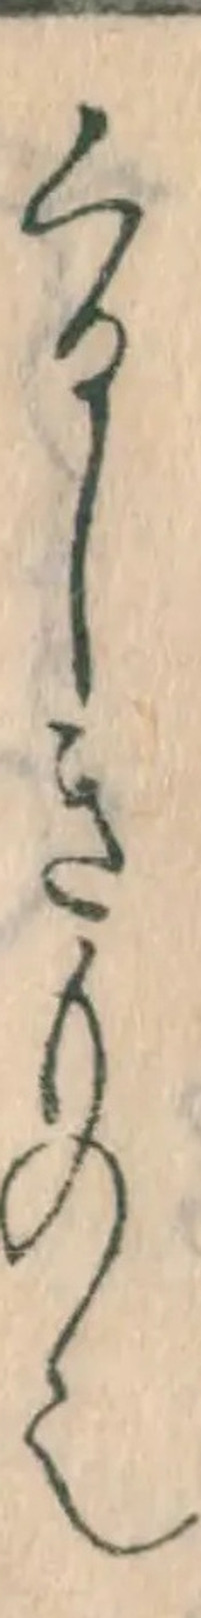くるしきもの也
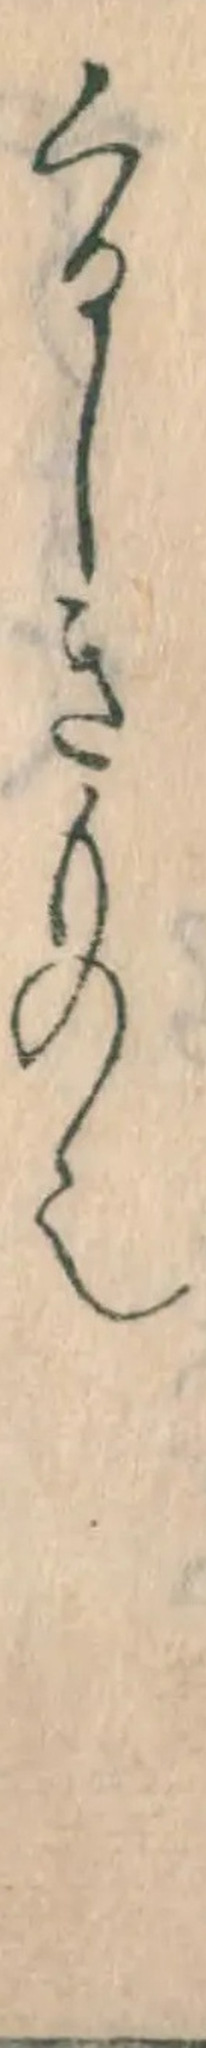くるしきもの也
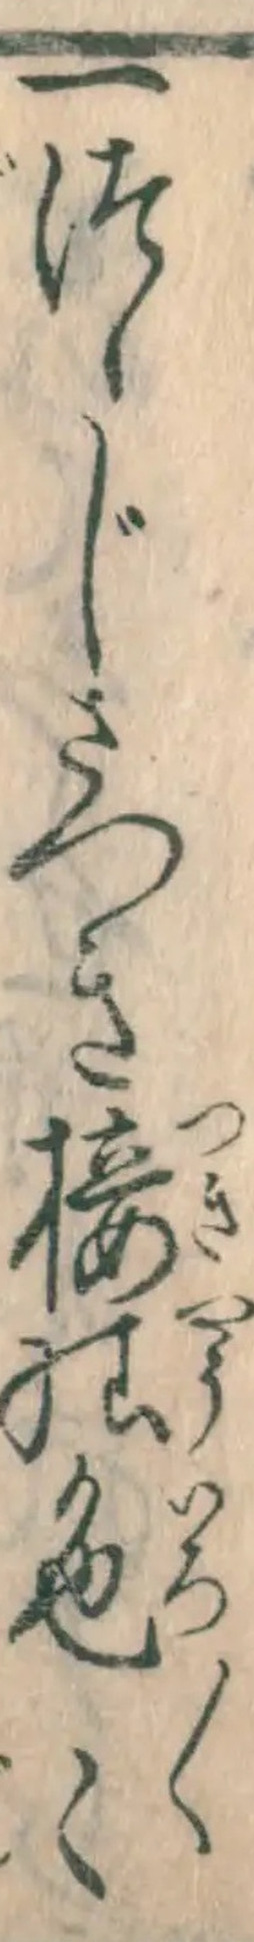一つゝじさつき接様色々
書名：錦繍枕 5巻. [1]
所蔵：国立国会図書館 National Diet Library, JAPAN
